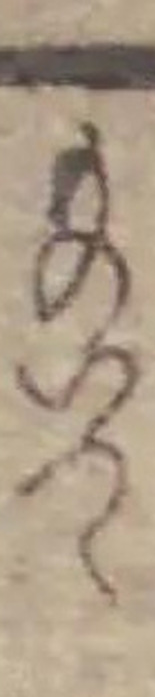ものいつく
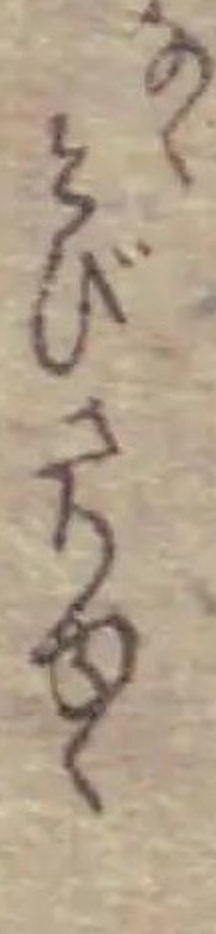とびさりゆく

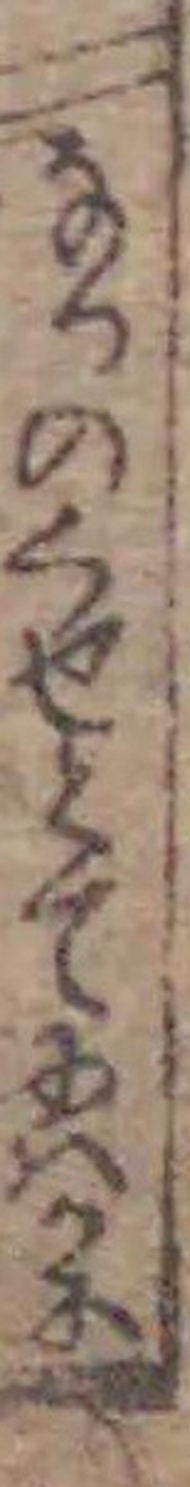なつのくせとてにはかに
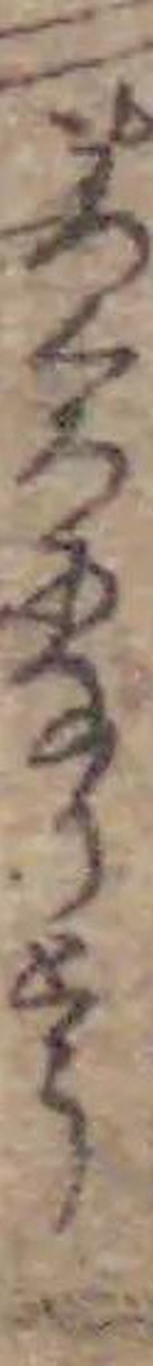まつくろになりとう
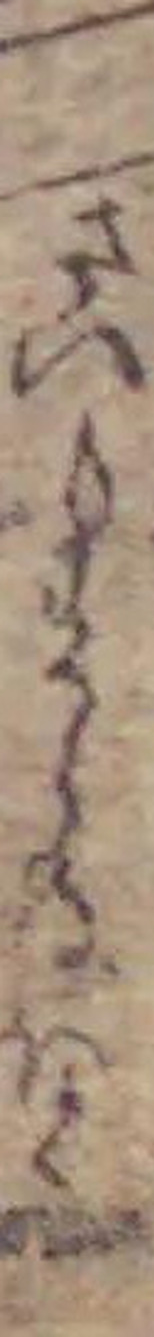さいもわからぬほと
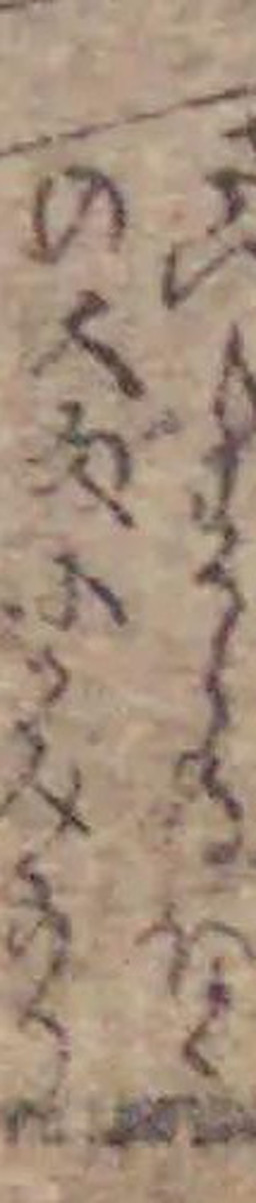の大雨にかみなり
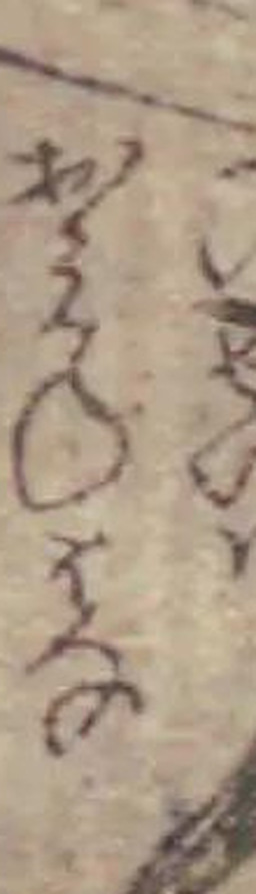おみねはな
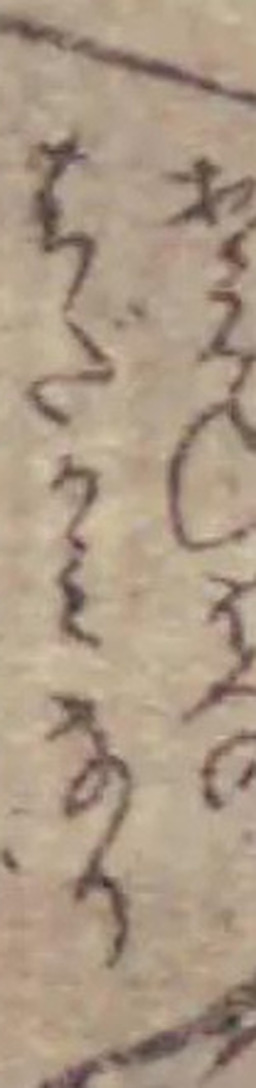はだかみなり
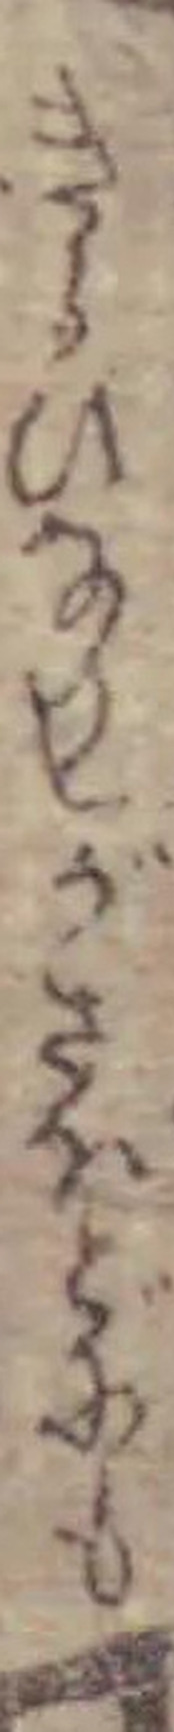きらひなりしがさほどにも
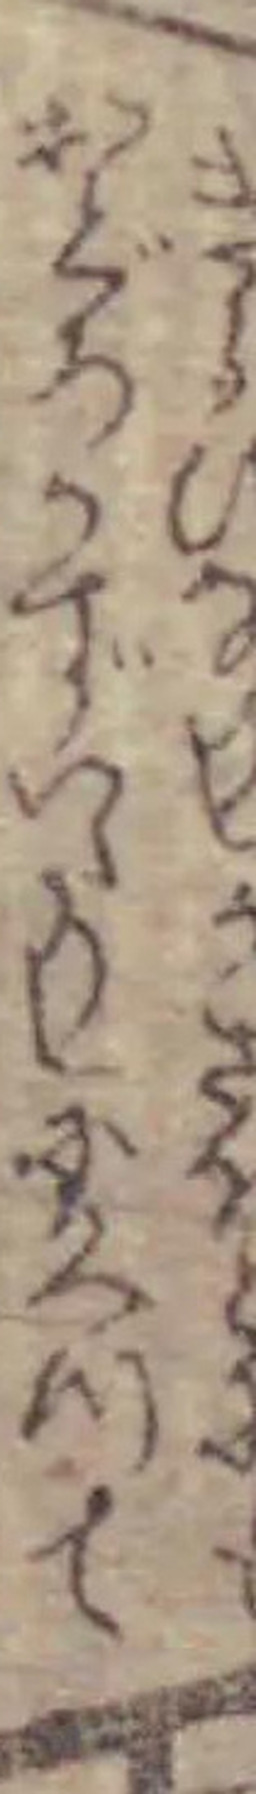おどろかずいたりしにかへつて
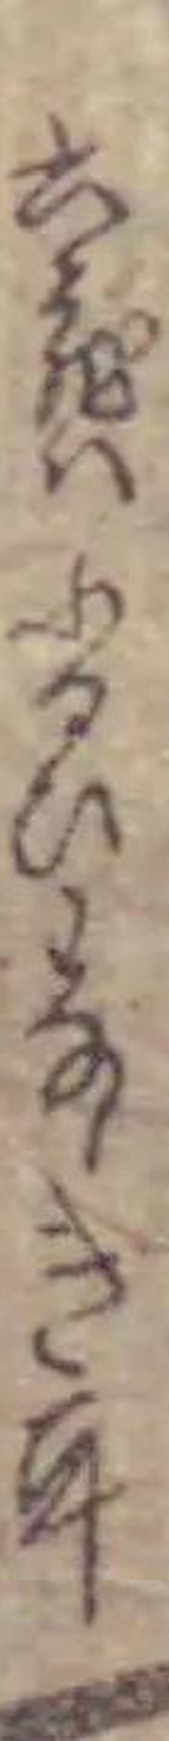六蔵はふるひわなゝき耳
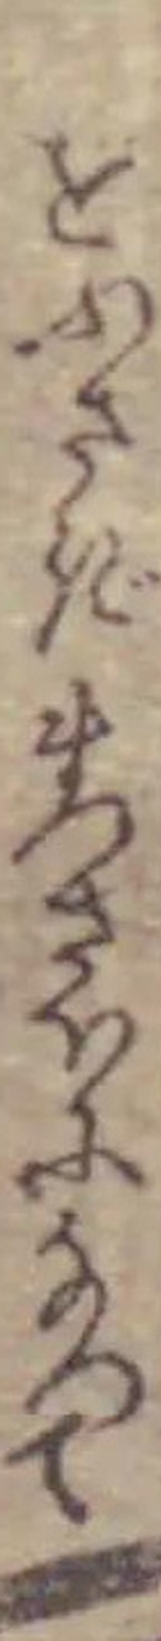をふさぎまつさほになつて
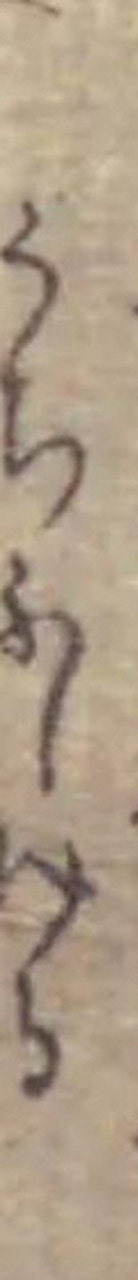うちふしける
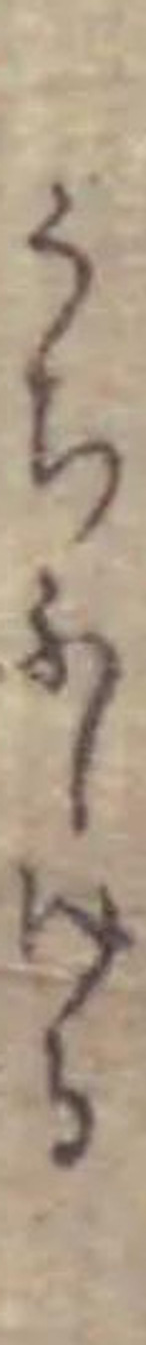うちふしける
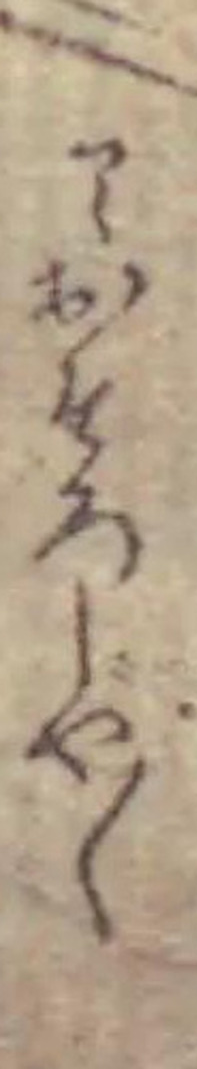アヽおそろしや〳〵

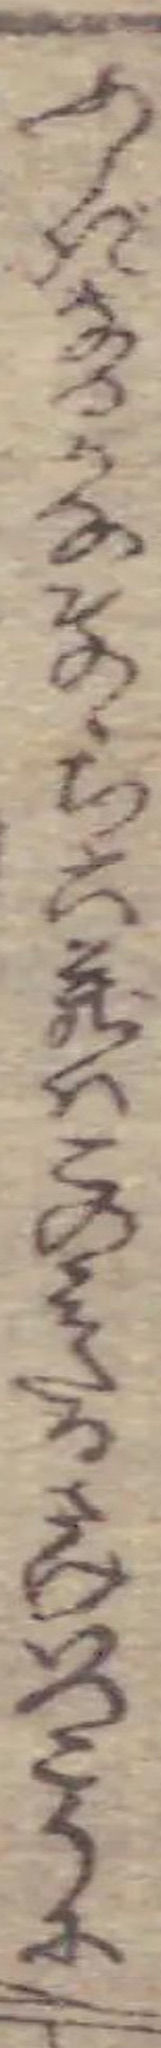ふしぎなるかなそのゝち六蔵はこのみけるさけいつこうに
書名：飛た間違矢口噂 2巻
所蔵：国立国会図書館 National Diet Library, JAPAN
